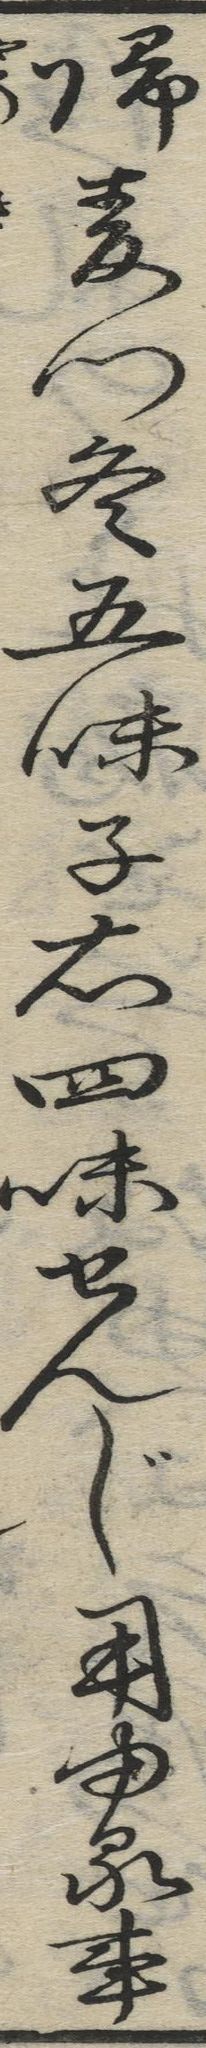帰麦門冬五味子右四味せんじ用ゆる事
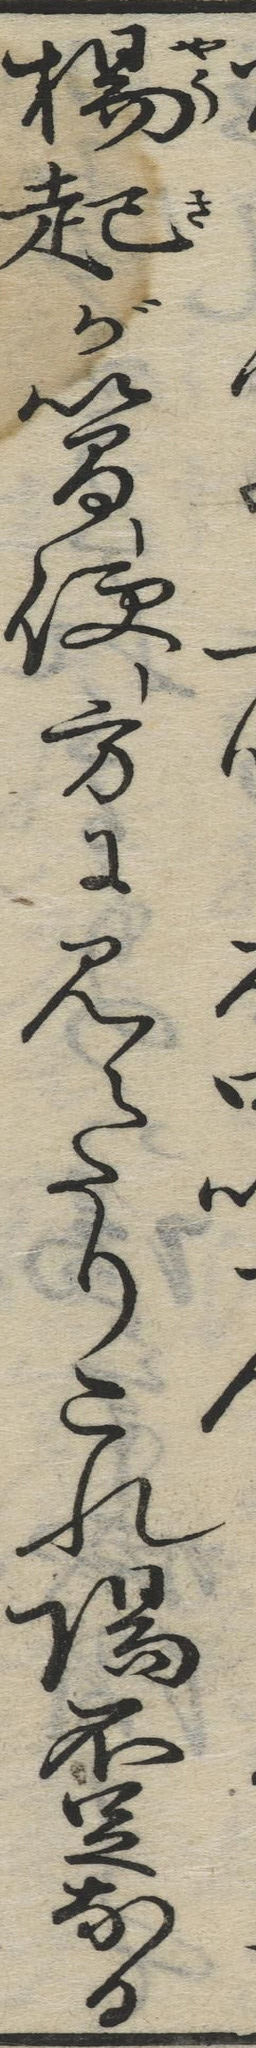楊起が簡便方に見えたりこれ陽不足なる
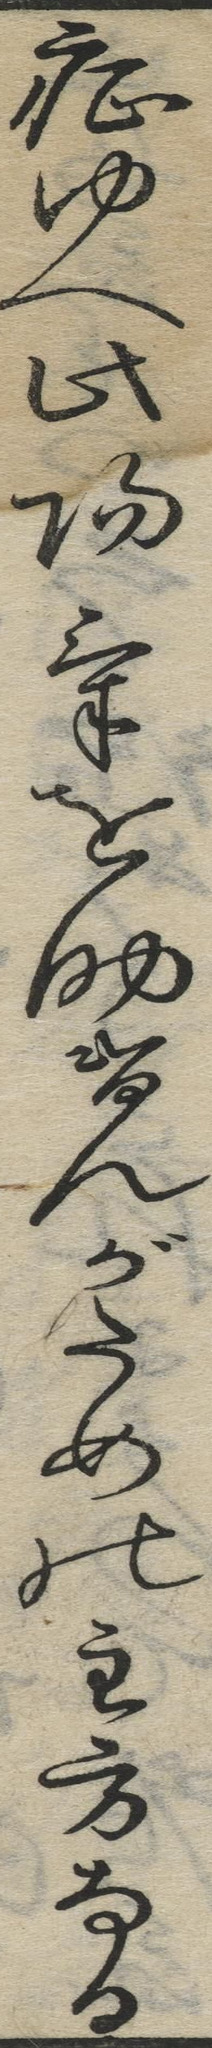症ゆへ此陽気を助けんがための主方なる
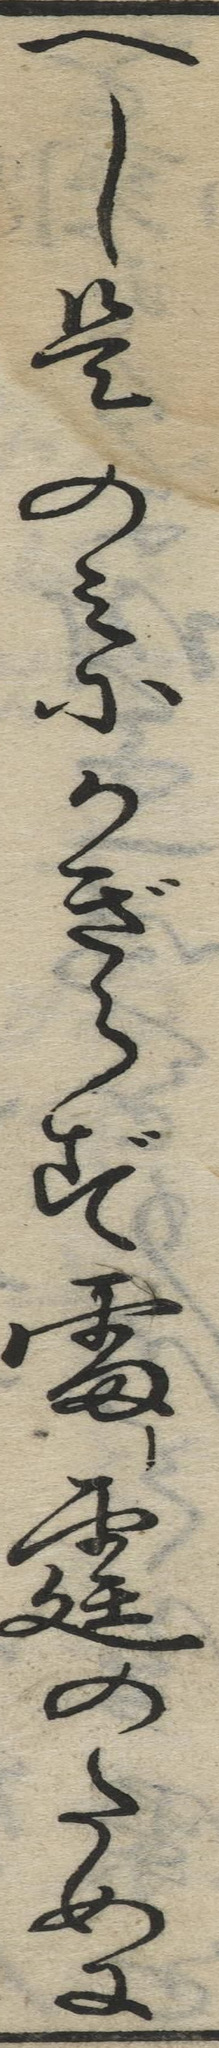へし是のみにかぎらず雷霆のために
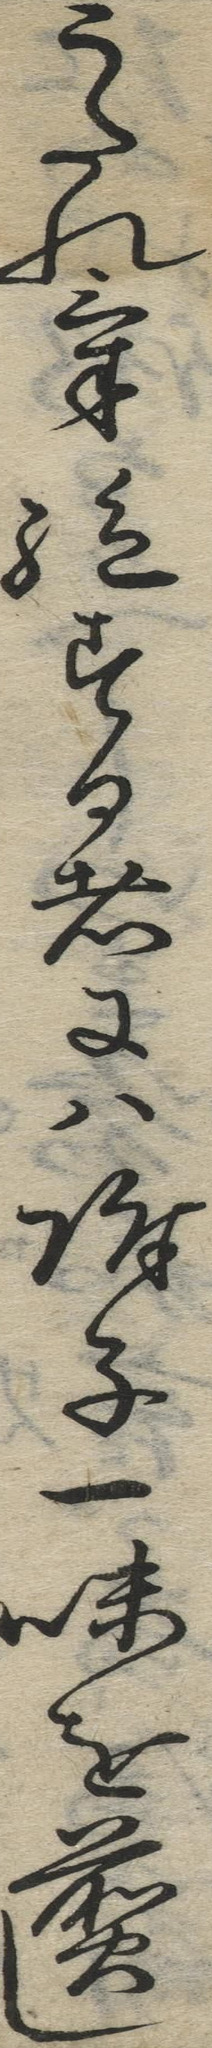うたれ気絶する者には附子一味を煎し
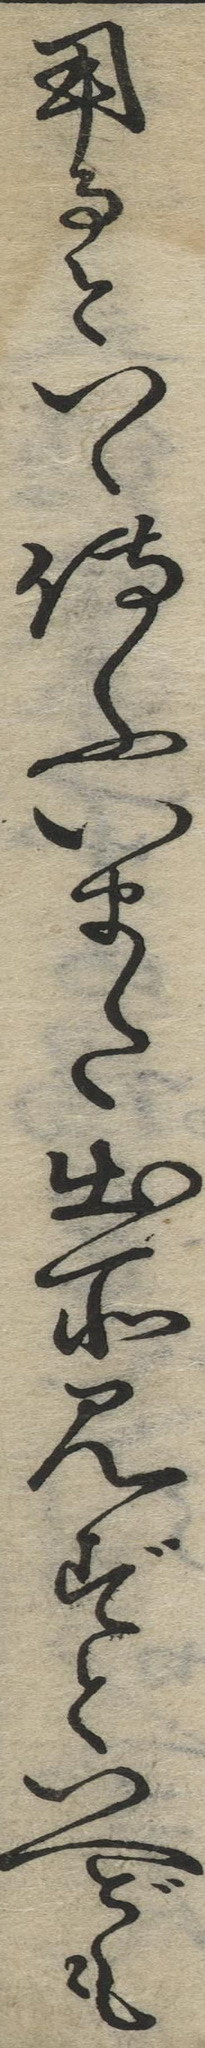用るといゝ傳ふむいまた出所見ずといへども

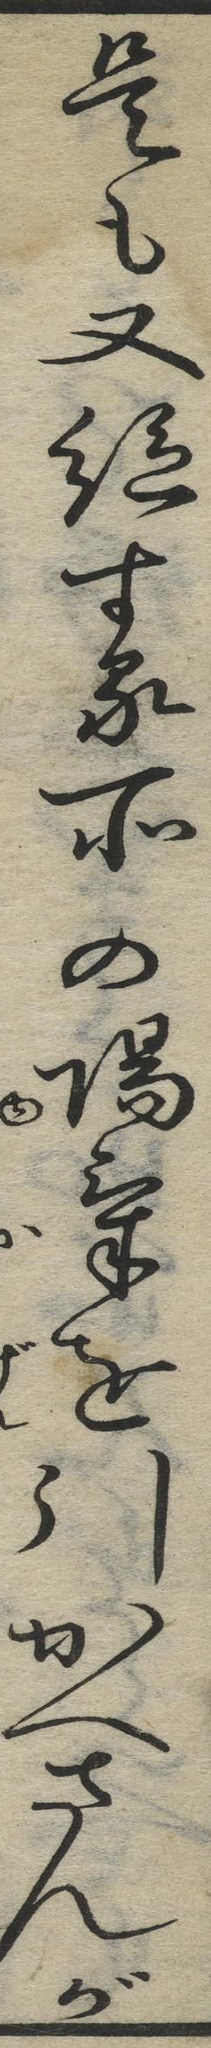是も又絶する所の陽気氣を引かへさんが
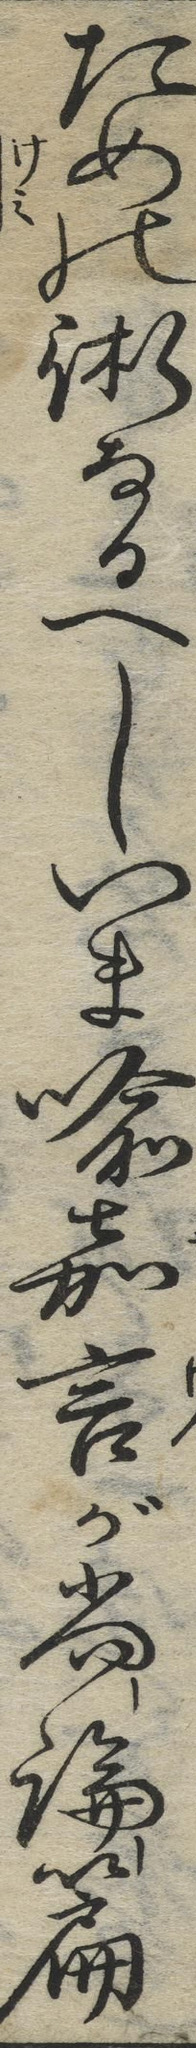ための術なるべし今喩嘉言が尚論編
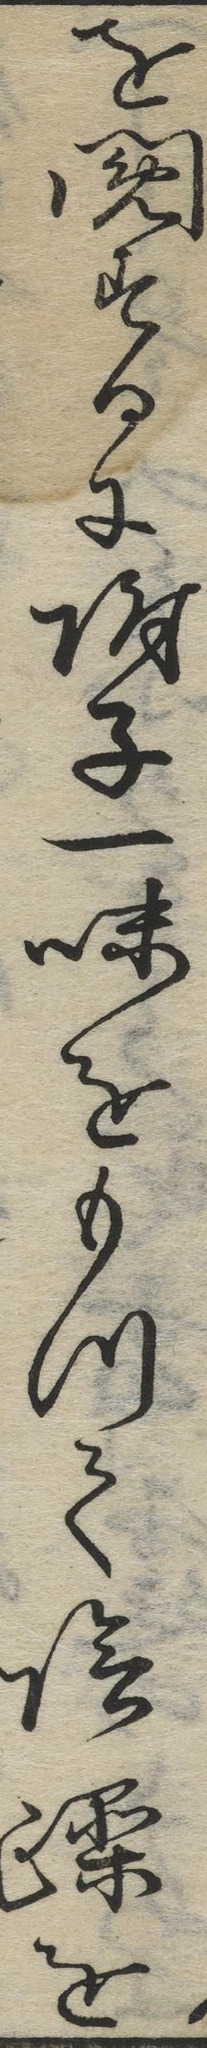を閲するに附子一味をもって陰躁を
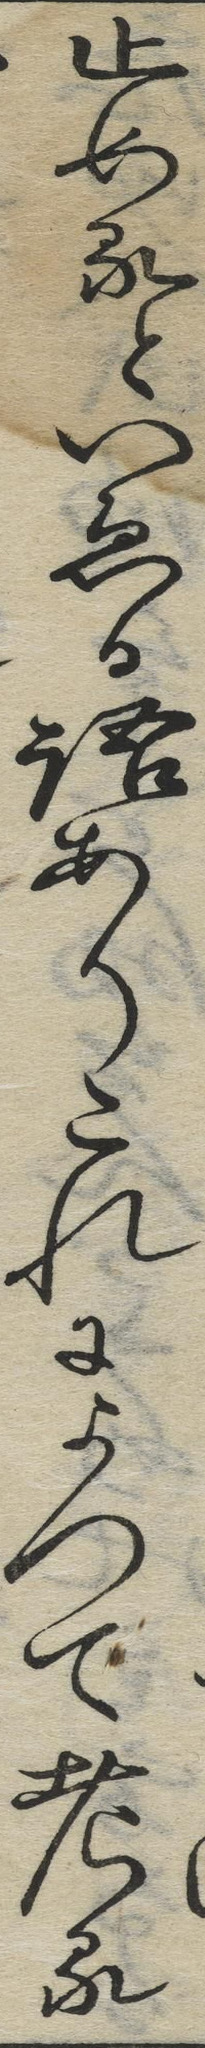止めるといへる語ありこれによって考る
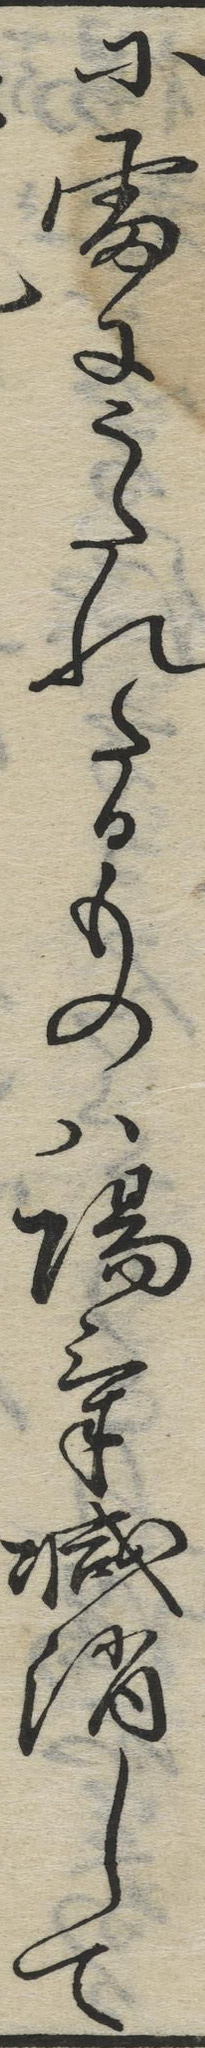に雷にうたれたるものは陽氣滅消して
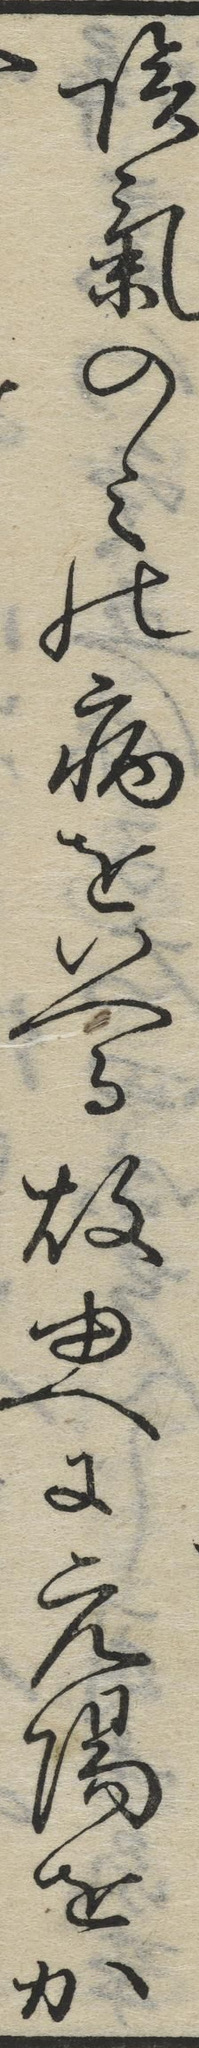陰氣のみのやまいといへる故ゆへに元湯をか
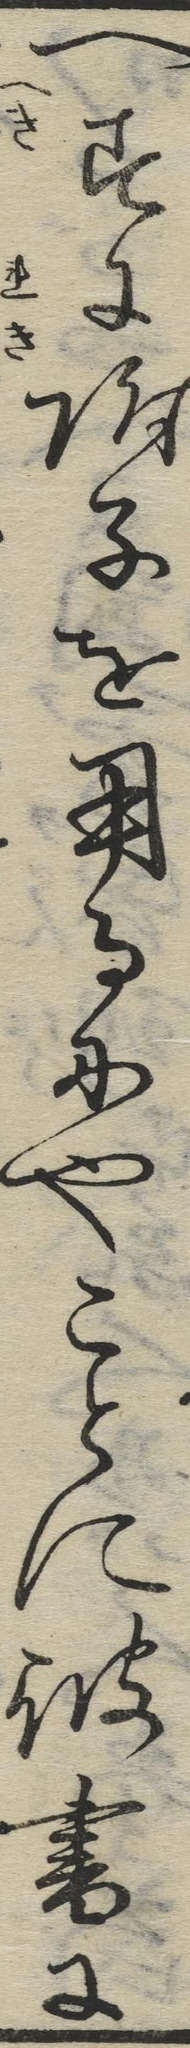へすに附子を用るにやことに彼書に
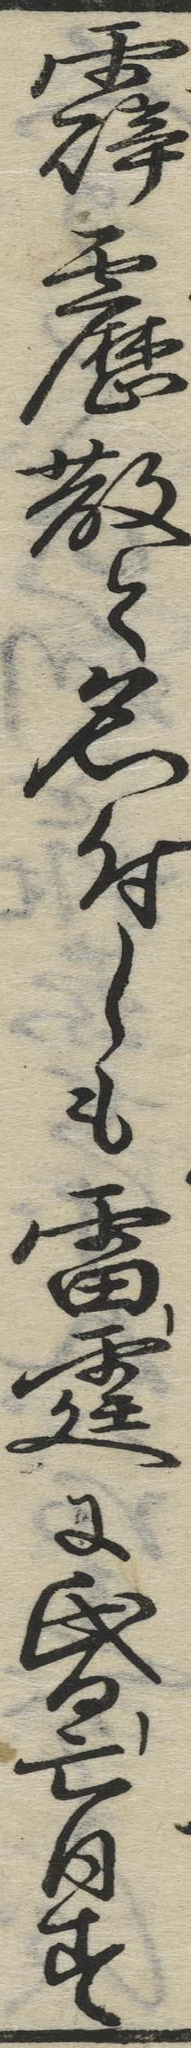霹靂散と名付けしも雷霆に昏盲す
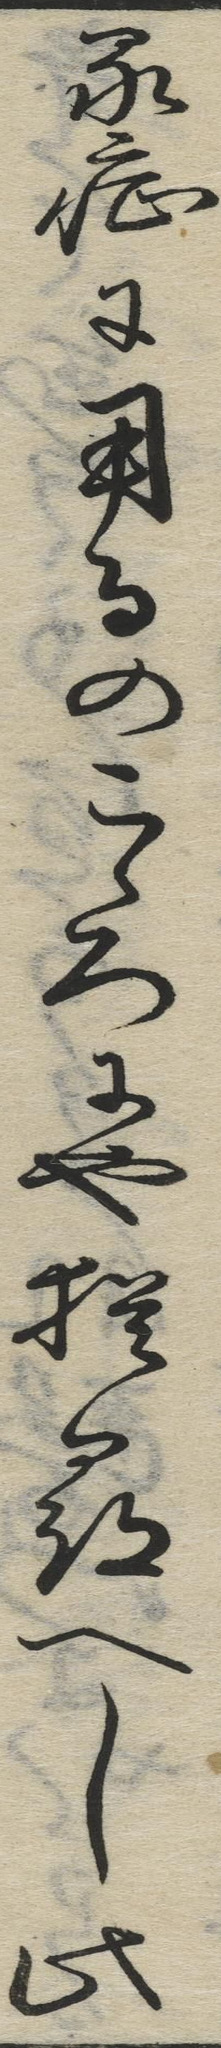る症に用るのこころにや猶尋へし此
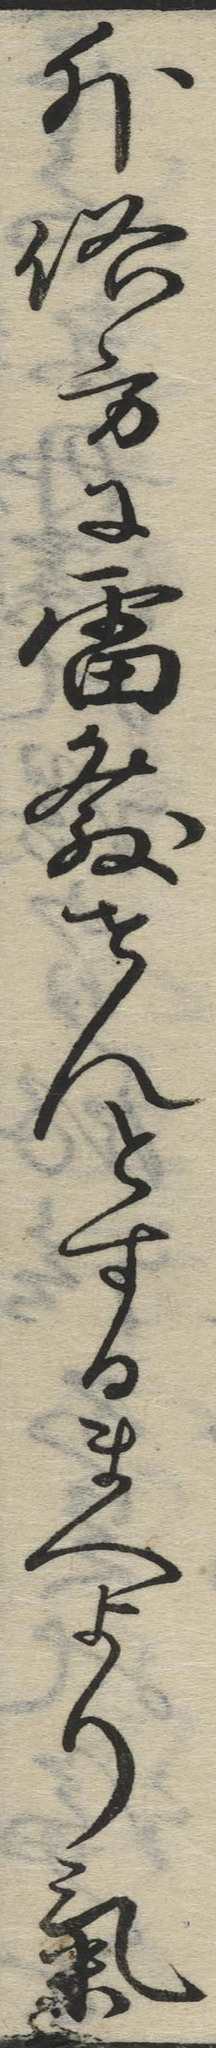外俗方に雷發せんとするまへより氣
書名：雷震記　完
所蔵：東京大学地震研究所図書室 Earthquake Research Institute Library, The University of Tokyo, JAPAN
